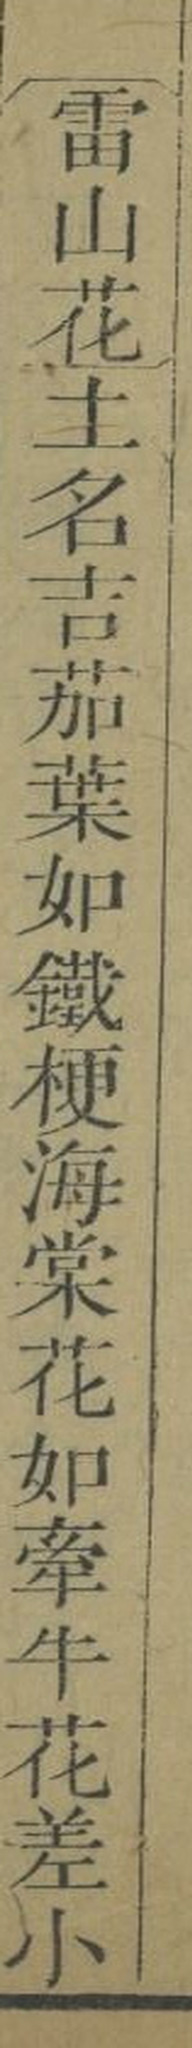[雷山花]土名吉茄葉如鉄梗海棠花如牽牛花差小
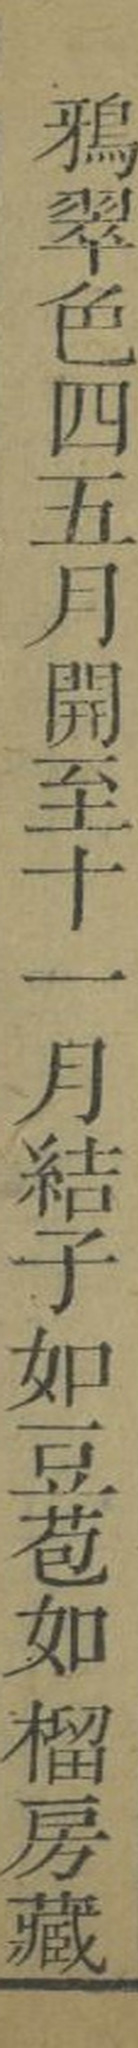鴉翠色四五月開至十一月結子如豆苞如榴房蔵
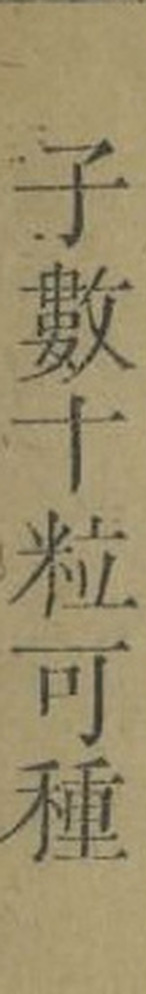子数十粒可種

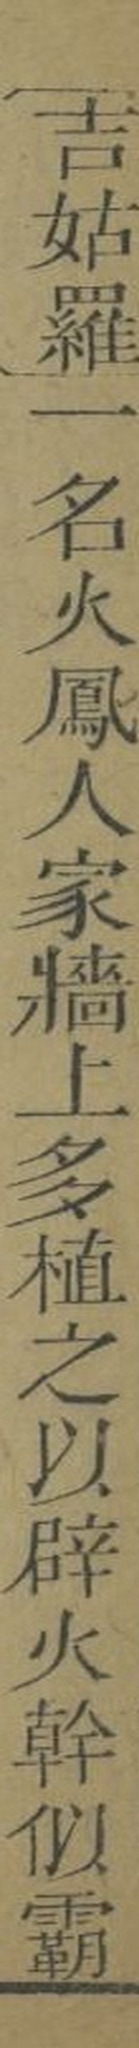[吉姑羅]一名火鳳人家牆上多植之以辟火幹似覇
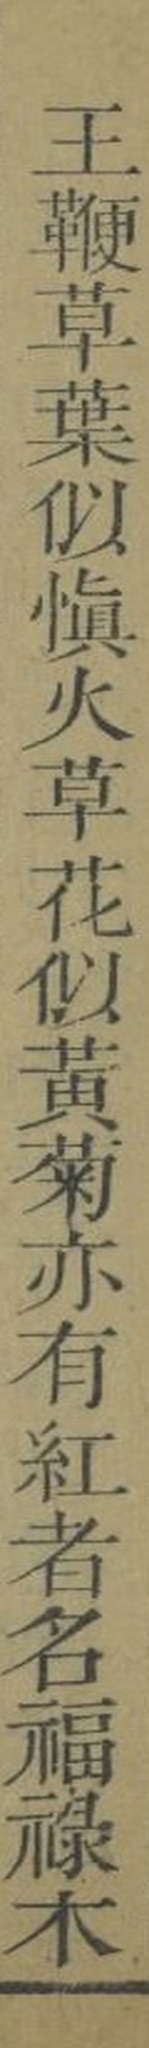王鞭草葉似慎火草花似黄菊亦有紅者名福禄木
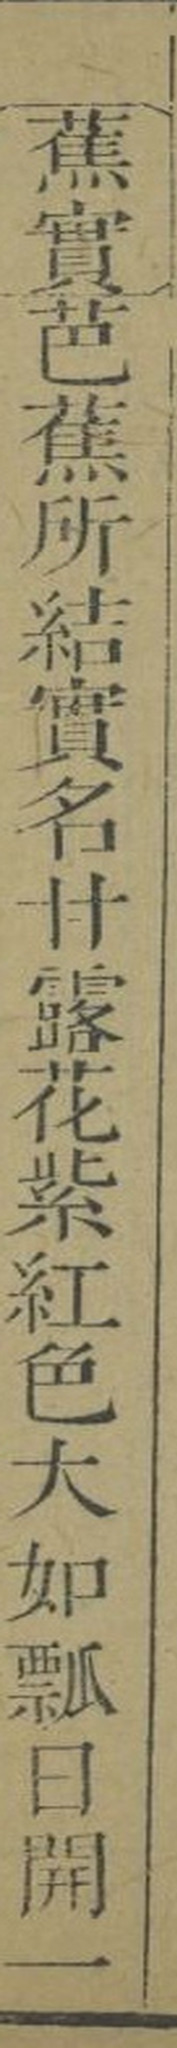[蕉実]芭蕉所結実名甘露花紫紅色大如瓢日開一
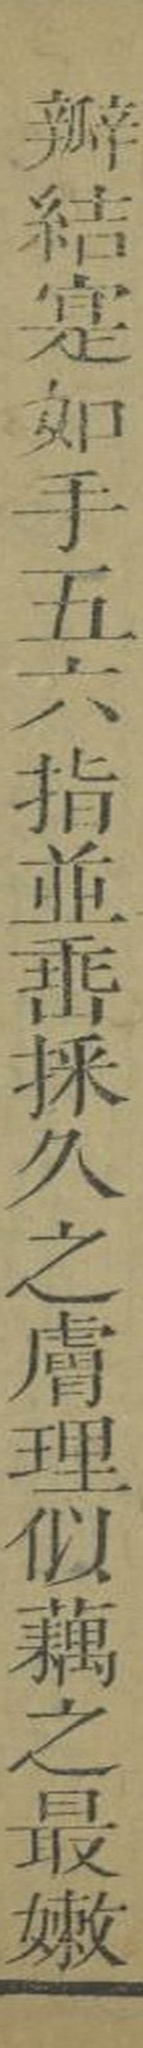弁結寔如手五六指並垂採久之膚理似藕之最嫩
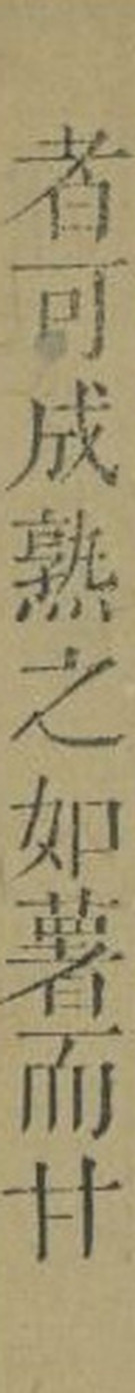者可成熟之如薯而甘
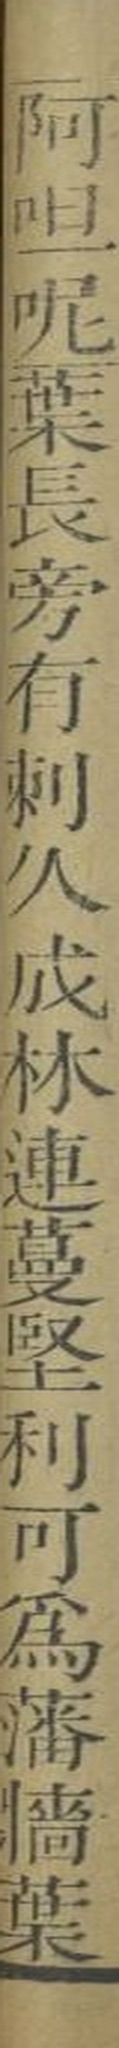[阿呾呢]葉長旁有刺久成林連蔓堅利可為藩牆葉
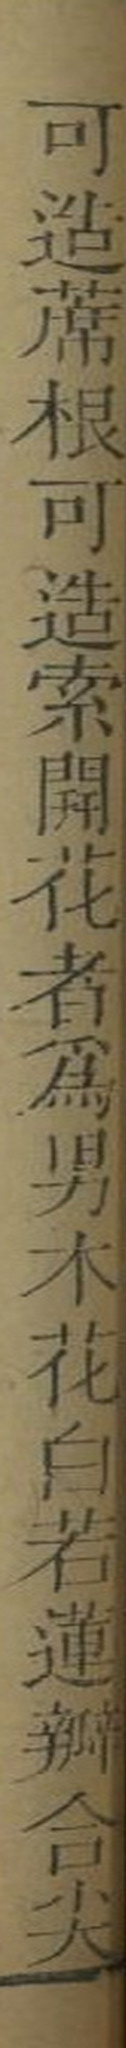可造蓆根可造索開花者為男木花白若蓮弁合尖
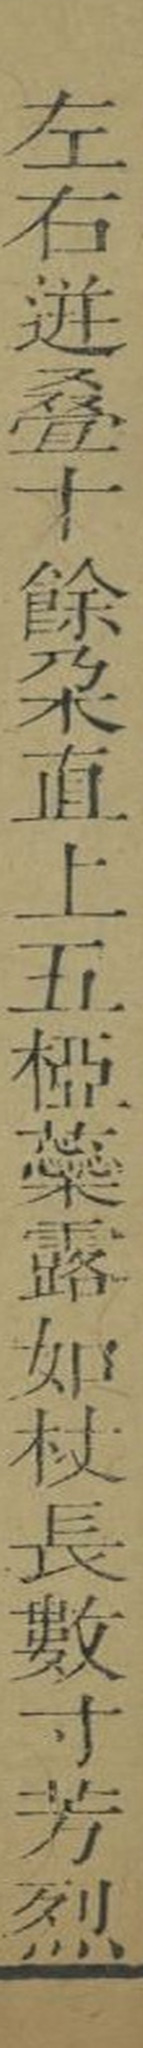左右迸叠十与朶直上五椏蘂露如杖長数寸芳烈
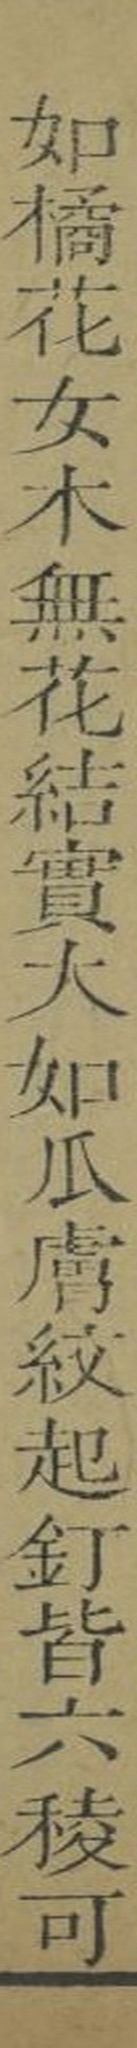如橘花女木無花結実大如瓜膚紋起釘皆六稜可
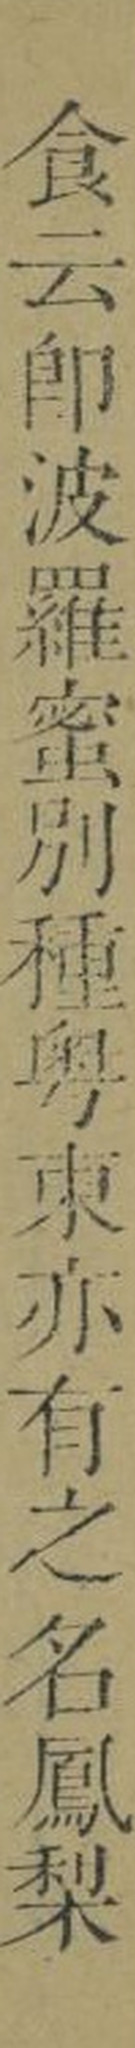食云即波羅蜜別種粤東亦有之名鳳梨
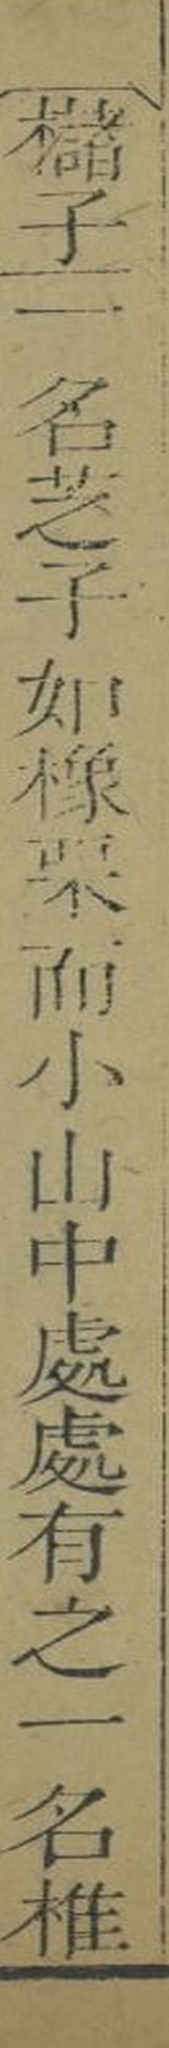[櫧子]一名芝子如橡栗而小山中処処有之一名椎
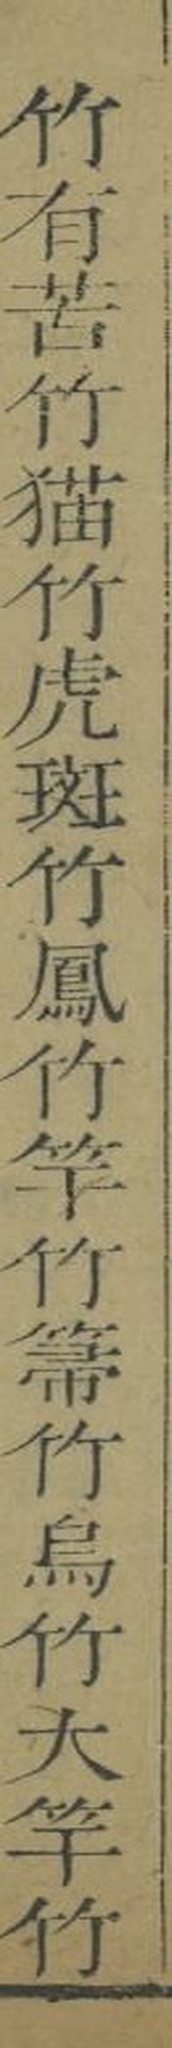竹有苦竹猫竹虎斑竹鳳竹竿竹箒竹烏竹大竿竹
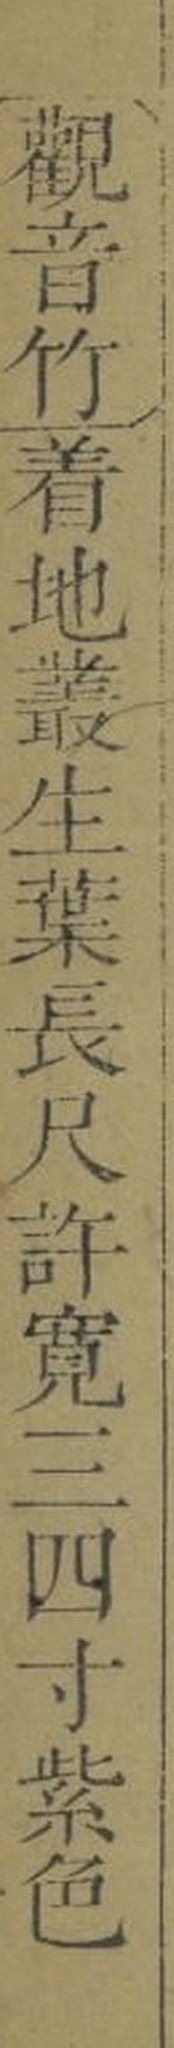[観音竹]着地叢生葉長尺許寛三四寸紫色
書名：中山伝信録 巻六
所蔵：University of the Ryukyus Library
